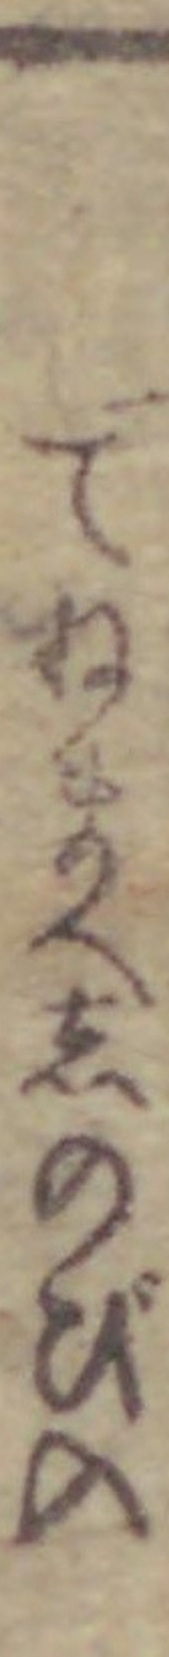てねまへしのび入
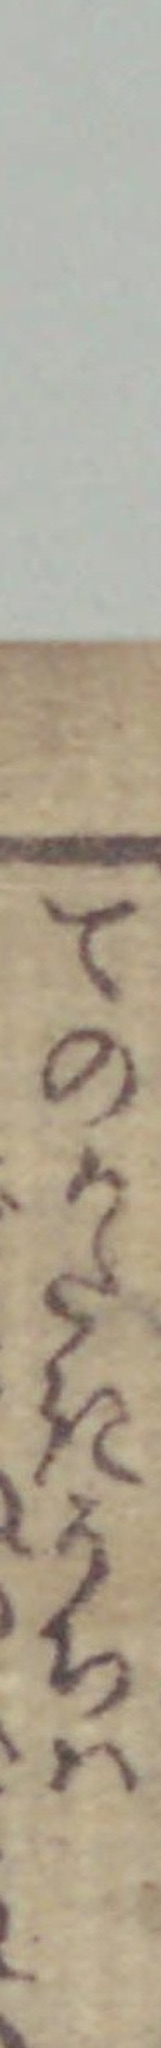てのかたきうちは
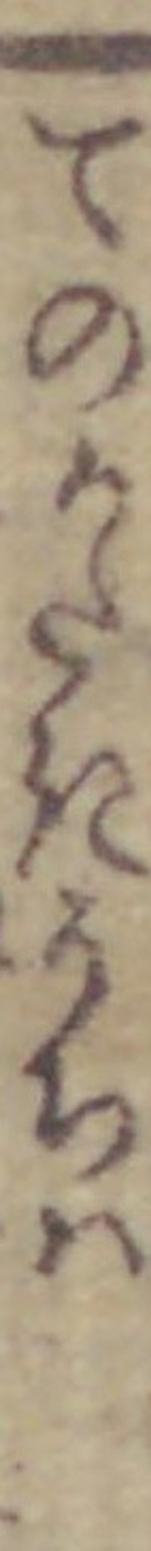てのかたきうちは
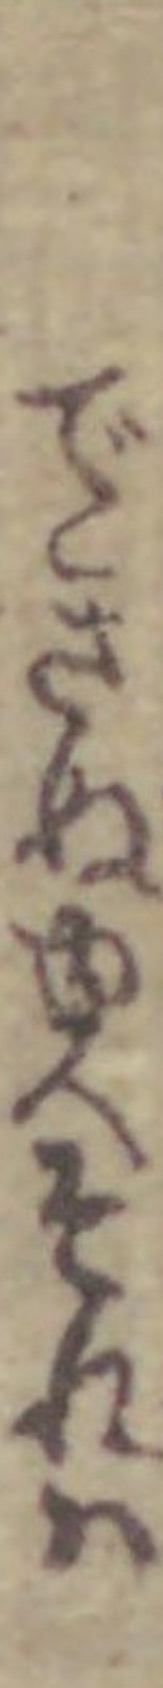できぬゆへそれは
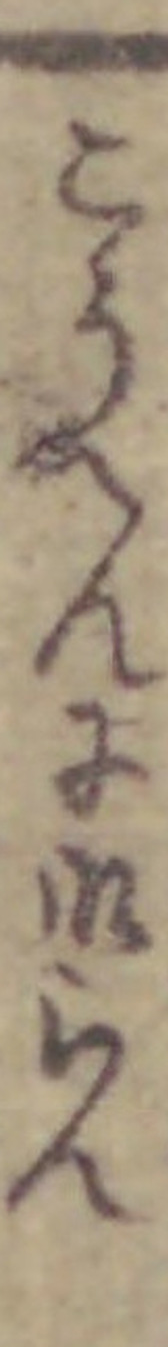こうへんに御らん
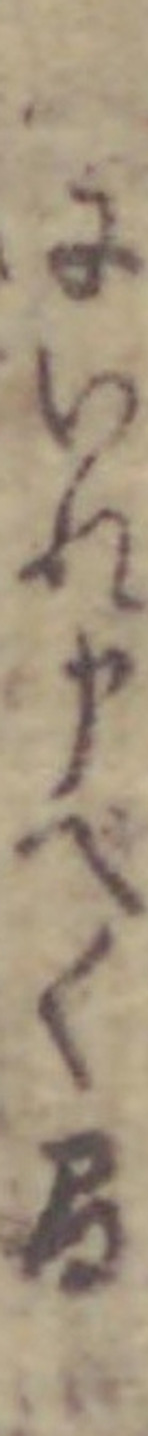にいれ申へく間
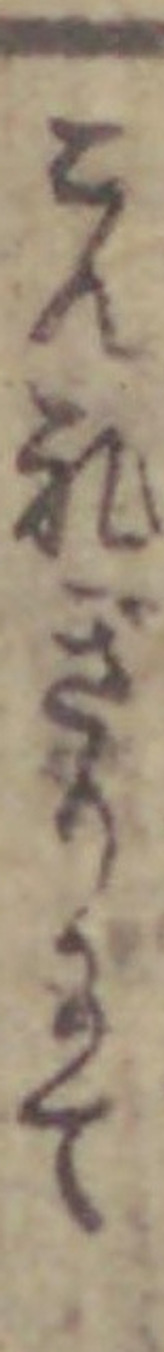こん礼ぎりにて
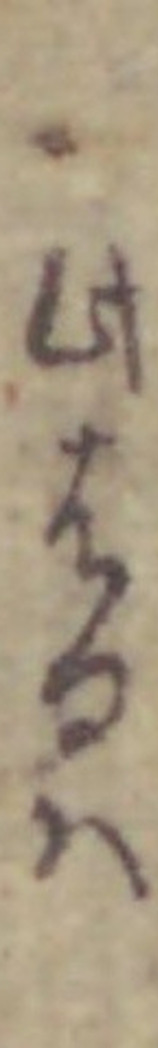此はるは
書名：間似合嘘言曽我 3巻
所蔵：国立国会図書館 National Diet Library, JAPAN
